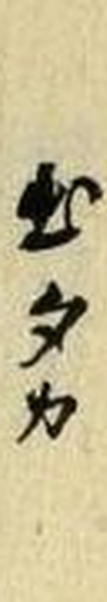出タカ
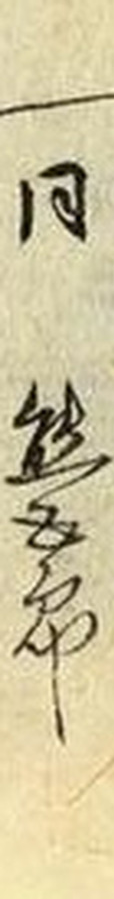同熊五郎
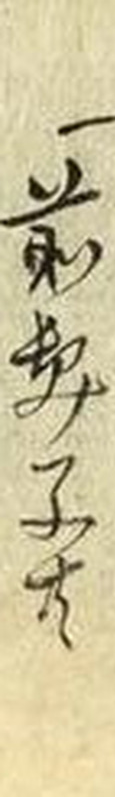前髪子供
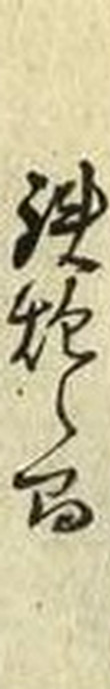鉄砲之間
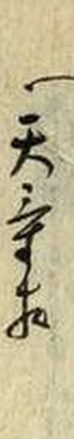天気相
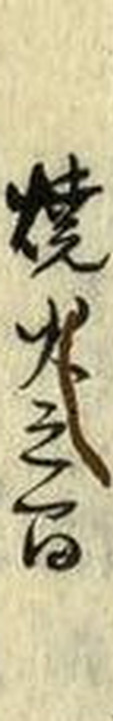焼火之間
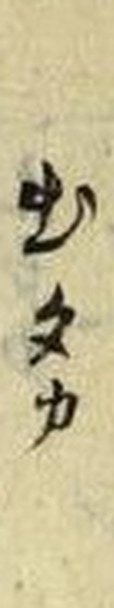出タカ
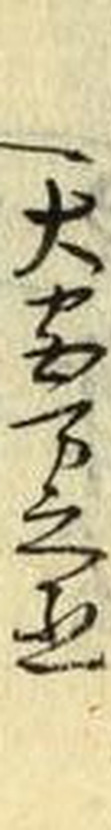大宮万之丞
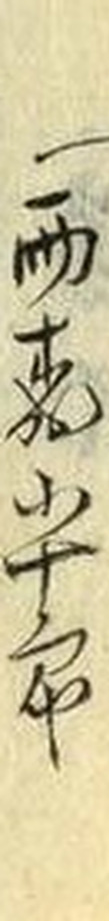雨森小十郎
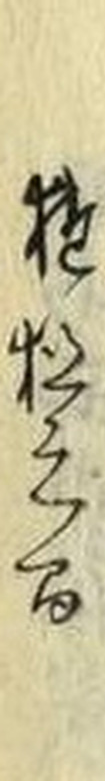韃靼之間
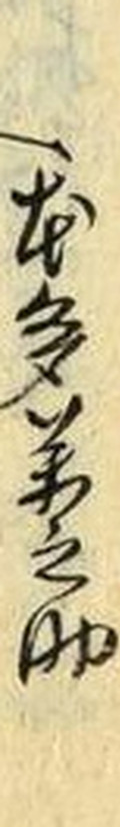本多万之助
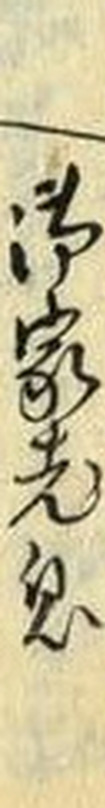御家老息
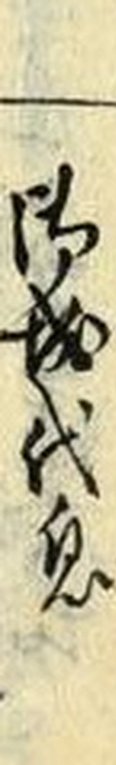御城代息
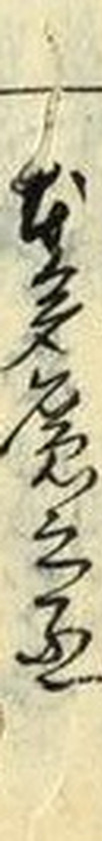本多万之助
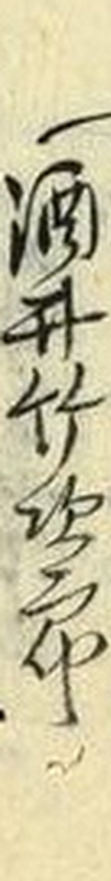酒井竹次郎
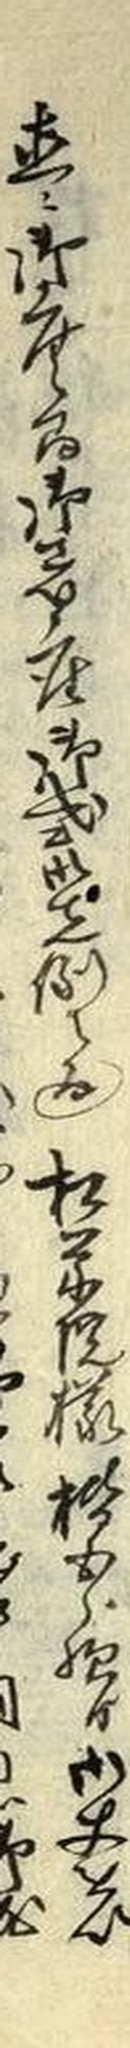直ニ御座之間御着座御式御先例之通松栄院様楷五郎様ゟ御使を以
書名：少傅日録抄（斉善付側向頭取日記、江戸并道中、初入在国、逝去後…
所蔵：福井県文書館 Fukui Prefectural Archives
